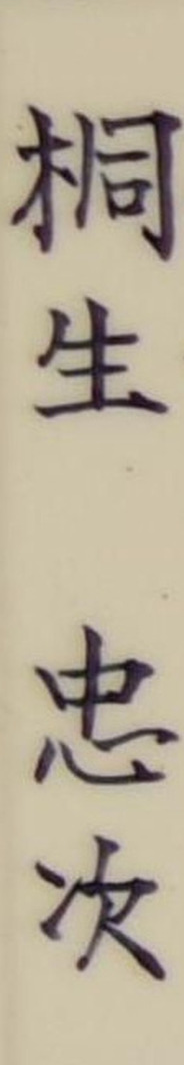桐生忠次

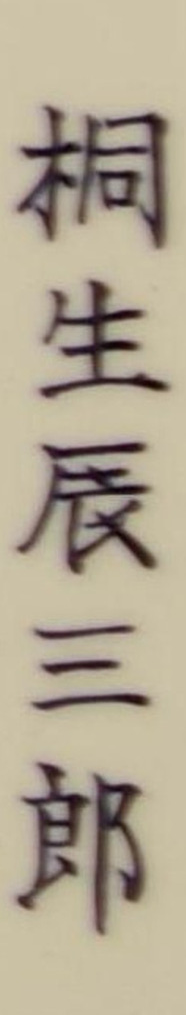桐生辰三郎
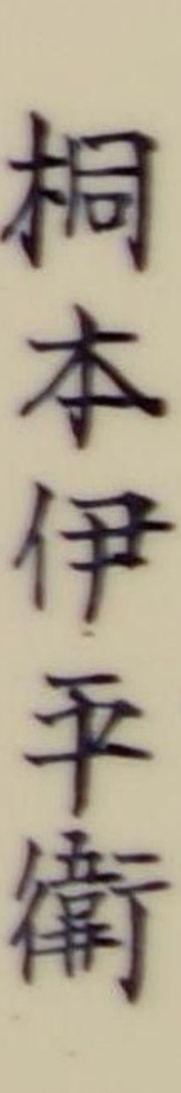桐本伊平衛
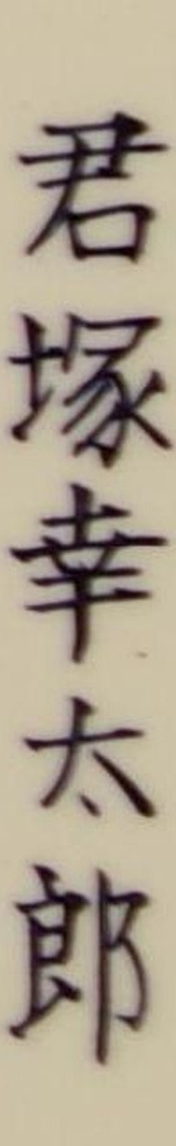君塚幸太郎
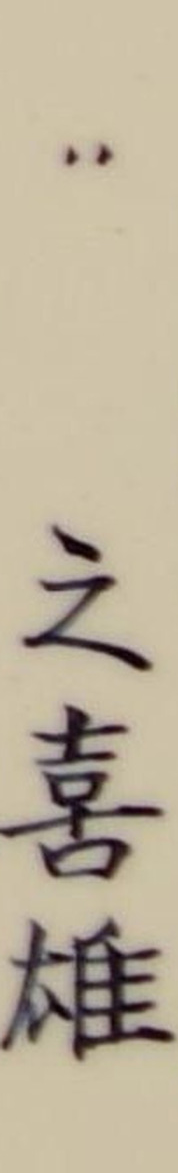之喜雄
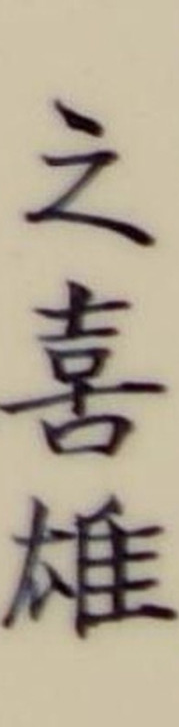之喜雄
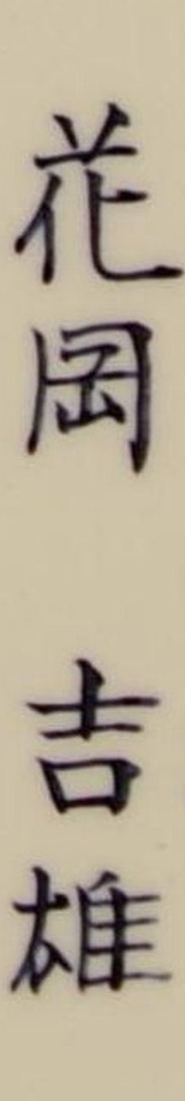花岡吉雄
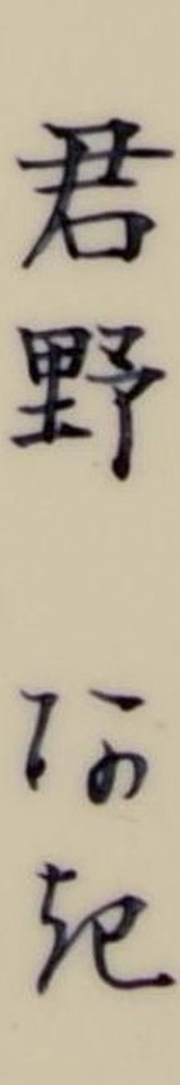君野あき
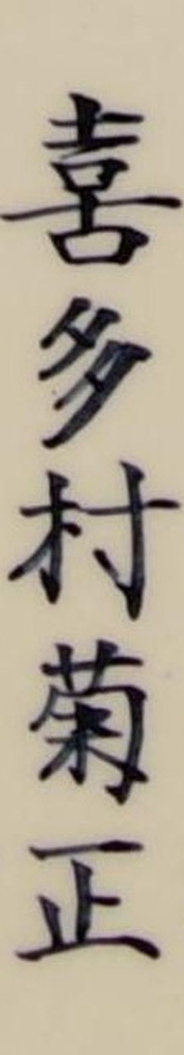喜多村菊正
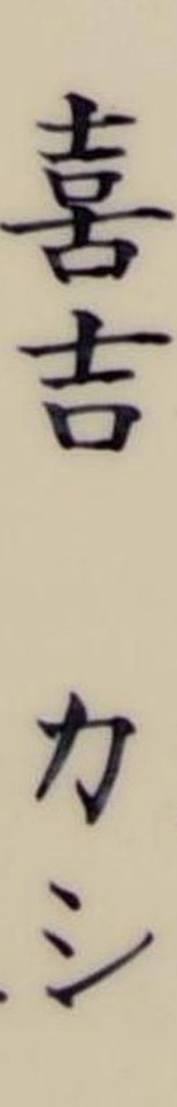喜吉カシ
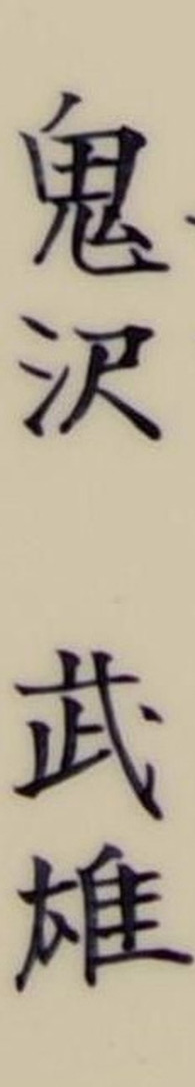鬼沢武雄
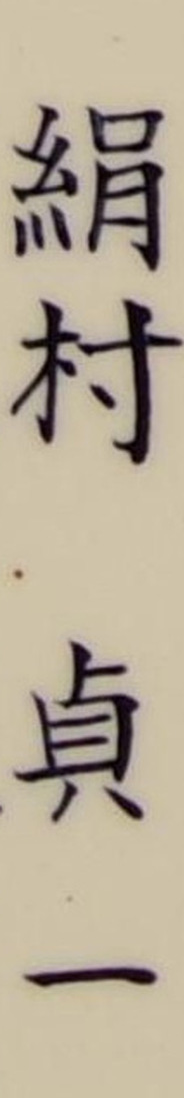絹村貞一
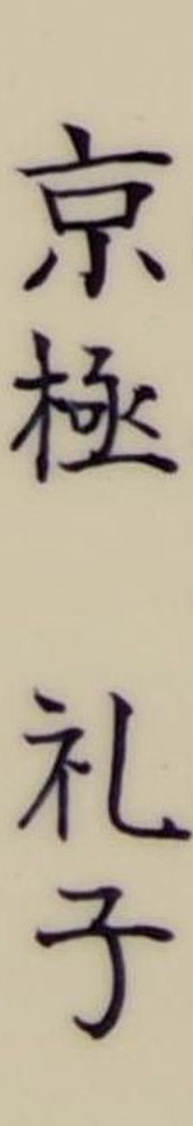京極礼子
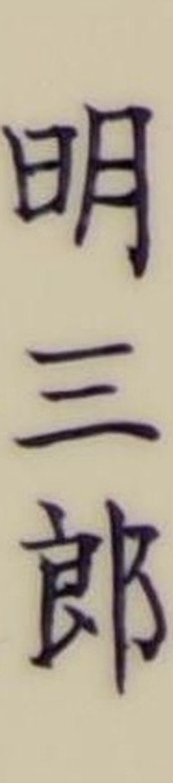明三郎
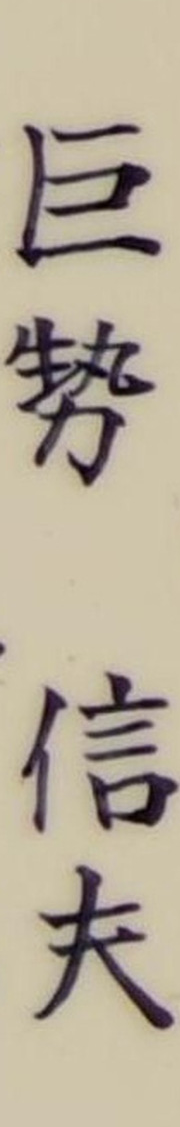巨勢信夫
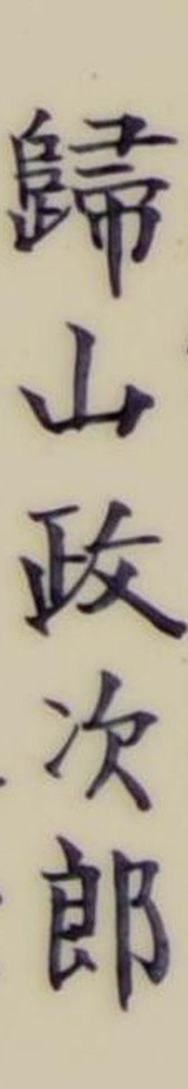帰山政次郎
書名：E~L
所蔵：高野山金剛峯寺
